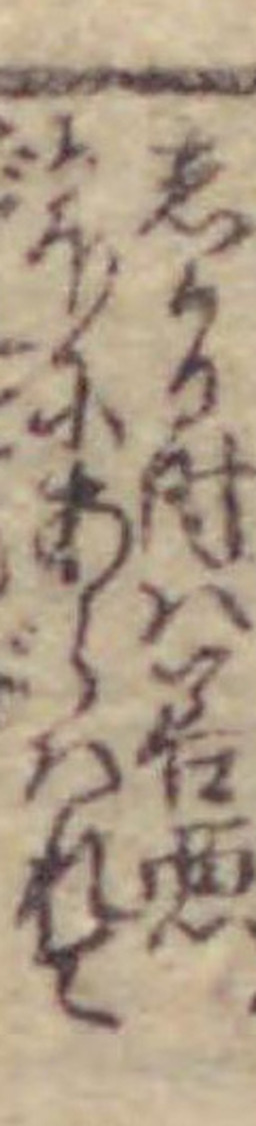かほにあらはれて
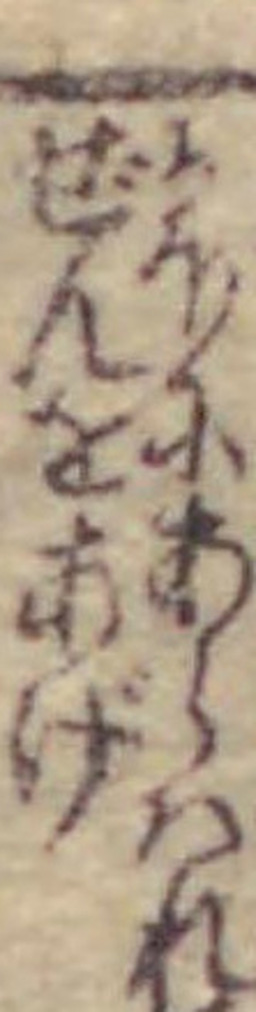ぜんをあげ
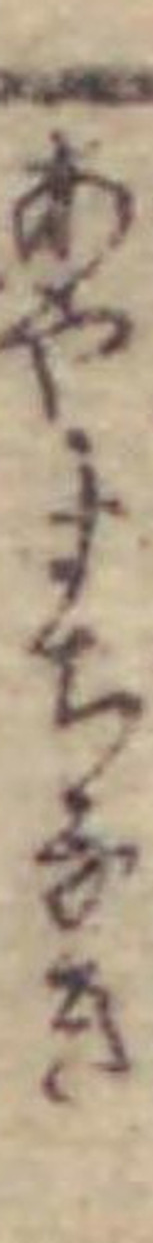あやまちなき
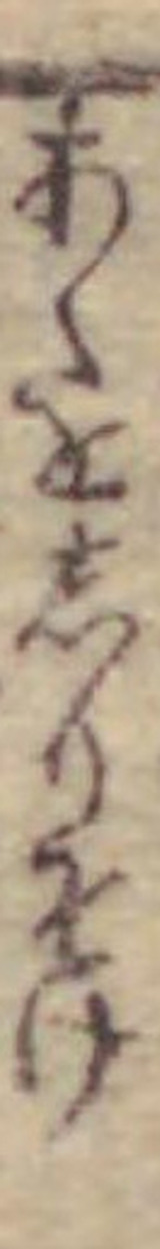あくをしりそけ
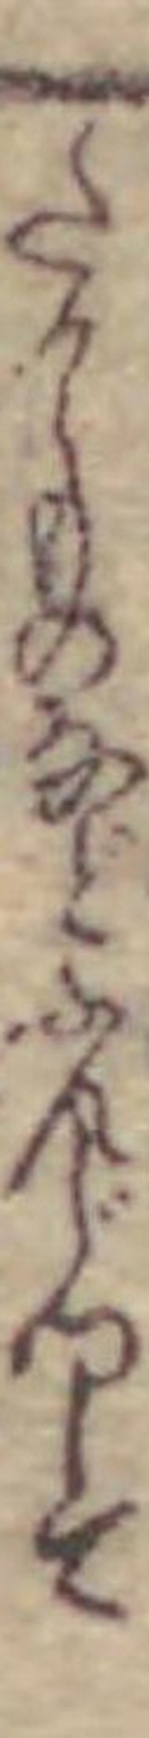たからものなどふんじつして
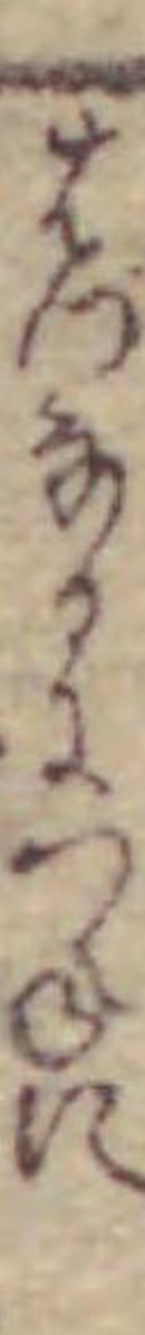はづなるにつねに
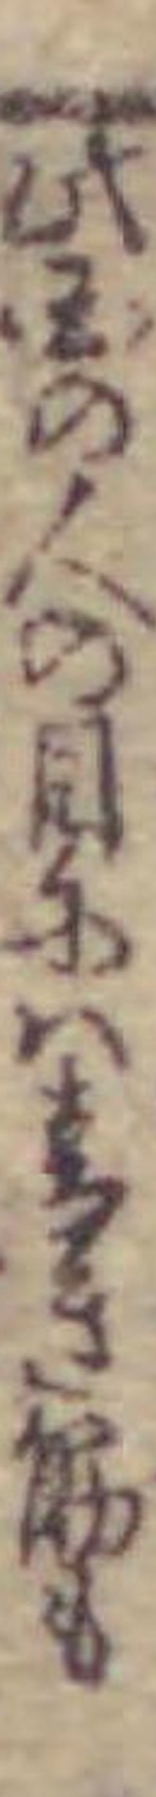此国の人の目には青き筋も
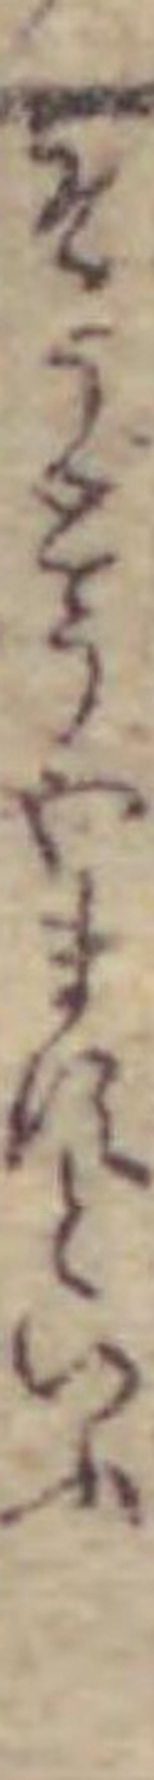そうどうやますといふ
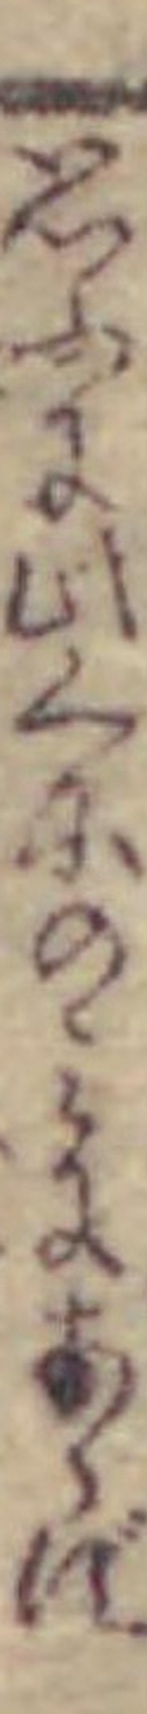思ふに此くにのみにあらず
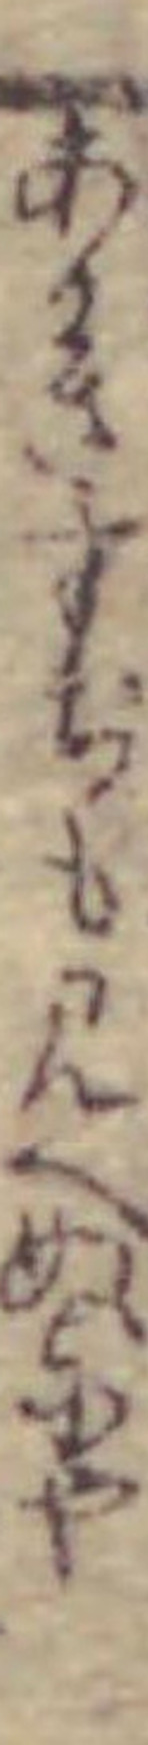あかきすぢも見へぬにや
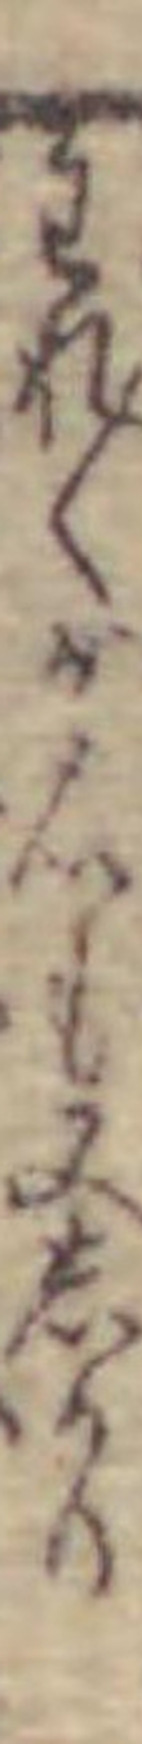われ〳〵が心も又しかり
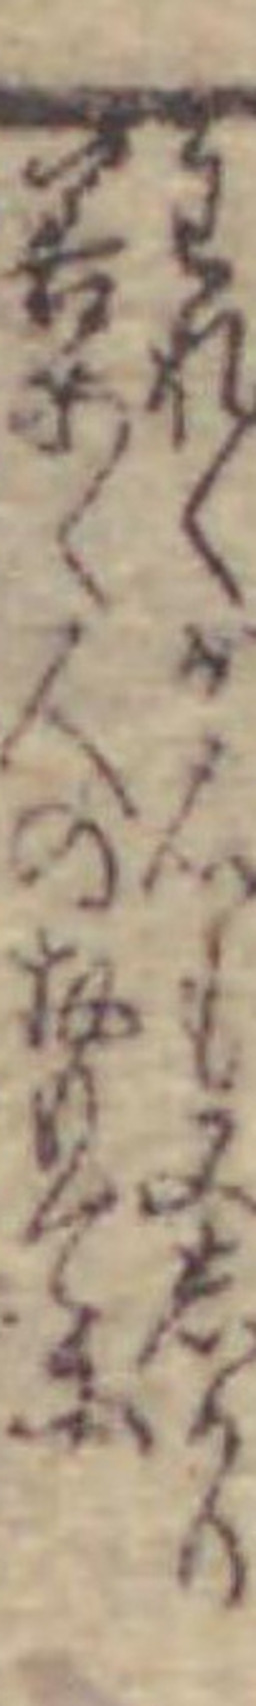善あく人のおもてに
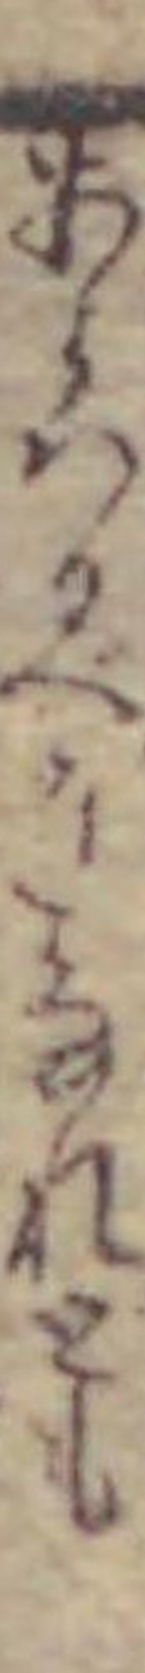あらはるべきなれども
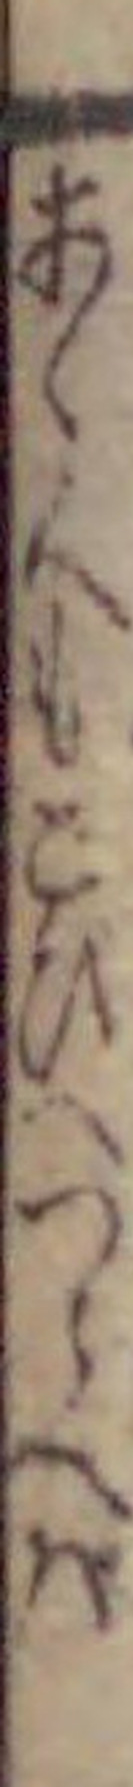あく人もこびへつらへば
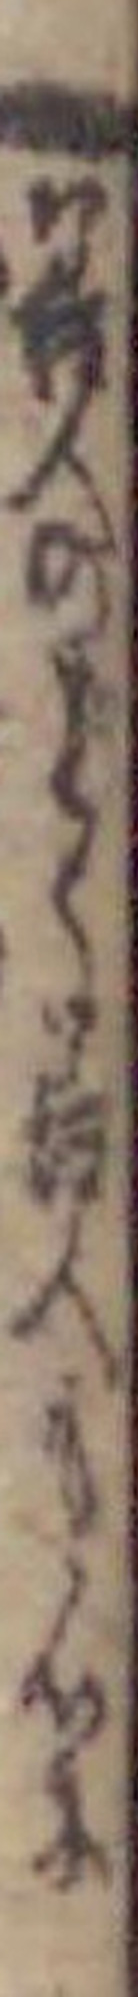善人のことく善人も心に
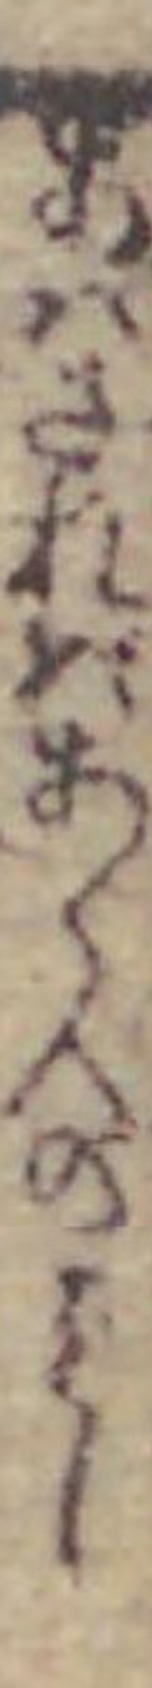あはさればあく人のごとし
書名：和荘兵衛後日話 : 3巻
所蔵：国立国会図書館 National Diet Library, JAPAN
